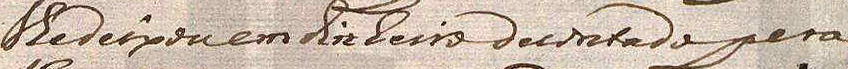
lhe deixou em dinheiro de contado pera
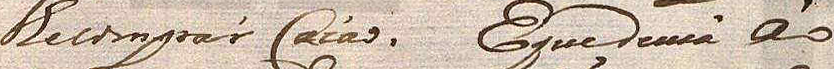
lhe comprar Cacáo. E que deuia áo
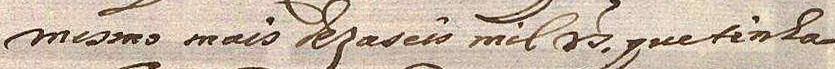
mesmo mais dezaseis mil rs̄, que tinha
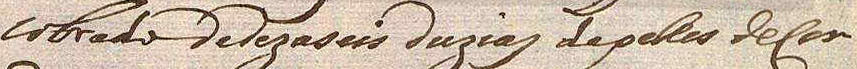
cobrado de dezaseis duzias da pelles de Cor
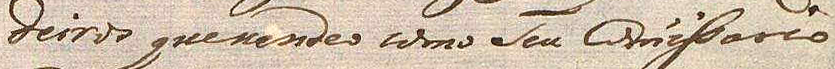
deiros que uendeo como seu Com̄issario.
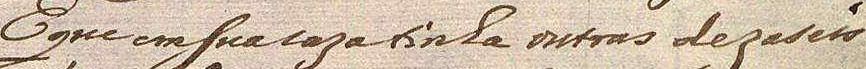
E que em sua caza tinha outras dezaseis
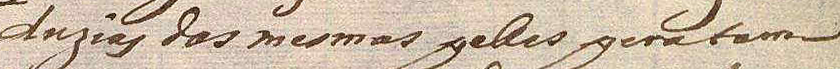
duzias das mesmas pelles pera tam
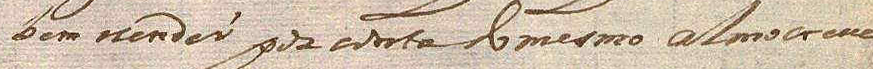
bem uender por conta do mesmo almocreue
